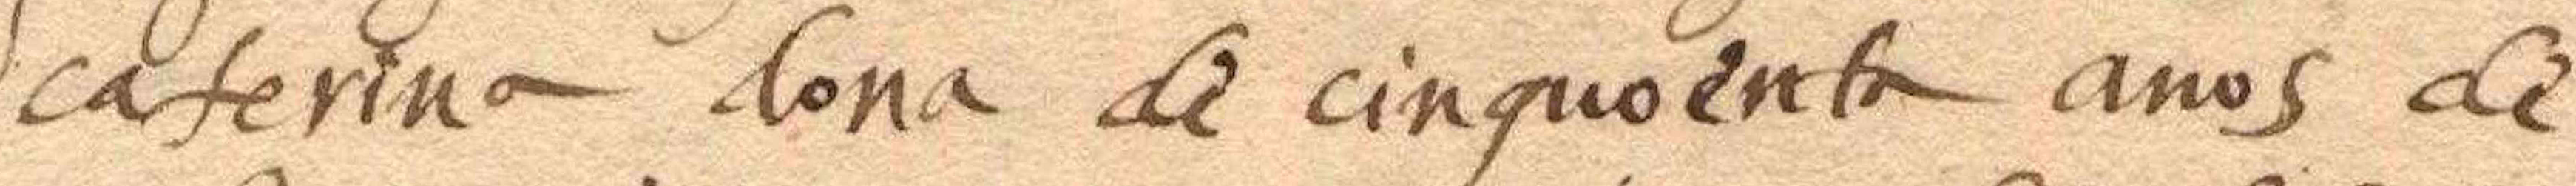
caterina dona de cinquoenta anos de
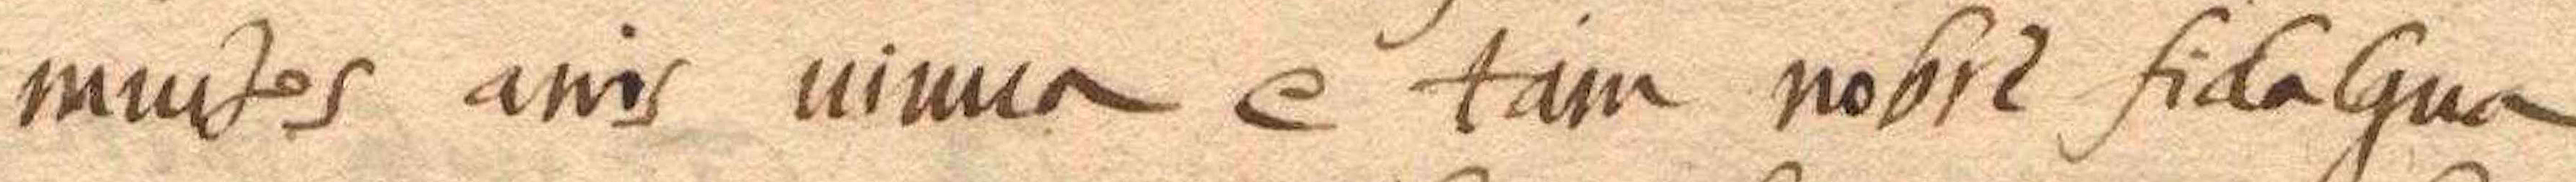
muitos anos uiuua e tam nobre fidalgua
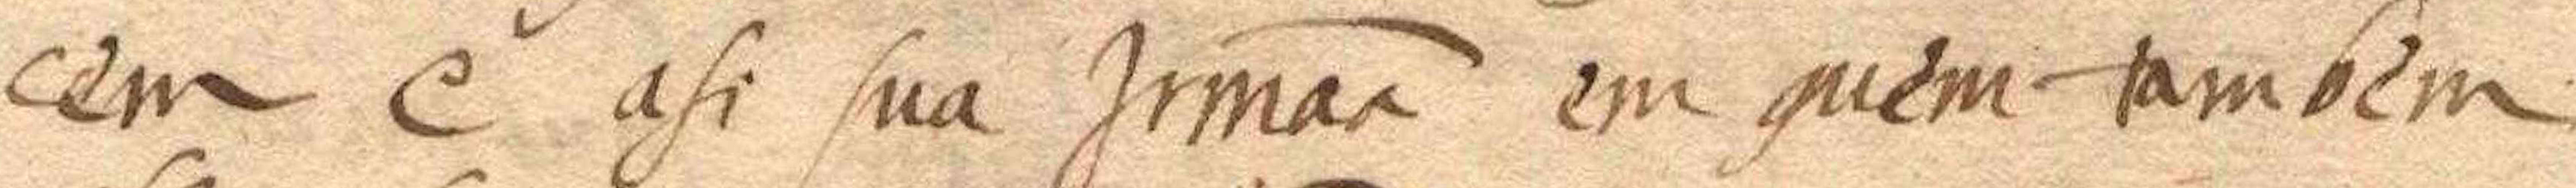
cem e asi sua Jrmāa em quem tambem
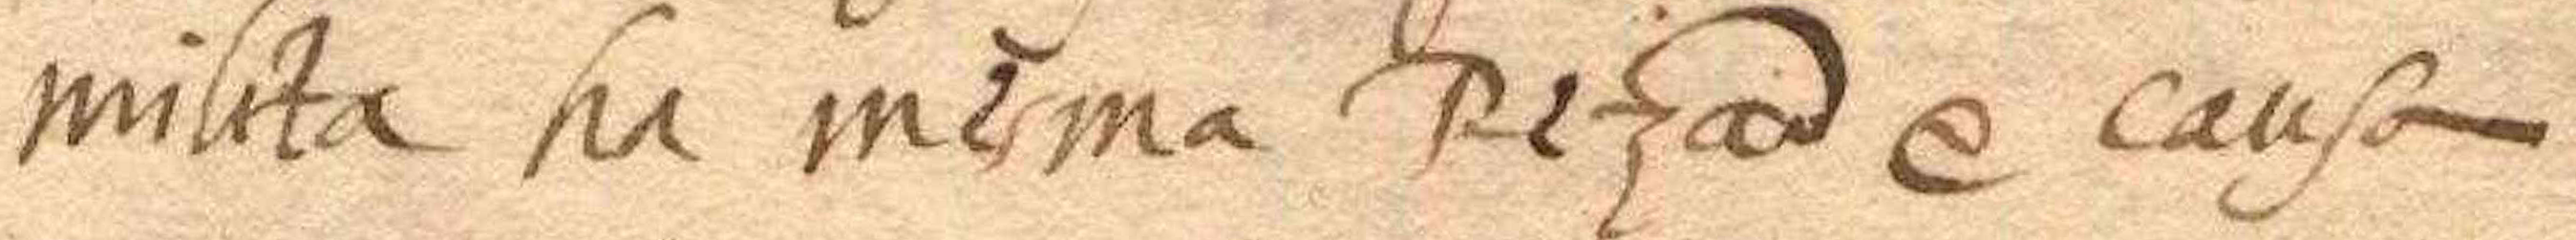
milita ha mesma Rezão e causa
